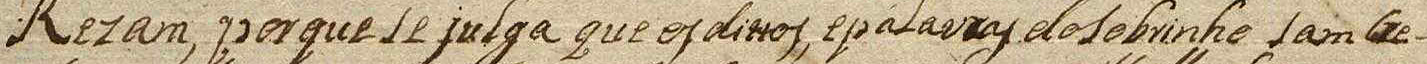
Rezam, porque se juLga que os dittos, e paLavras do sobrinho sam cre
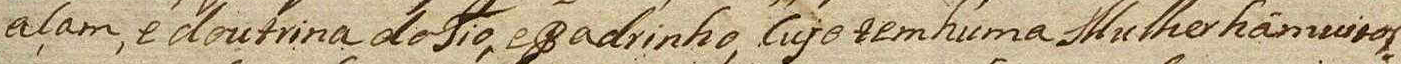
aÇam, e doutrina do Tio, e Padrinho, Cujo tem huma Mulher há muitos
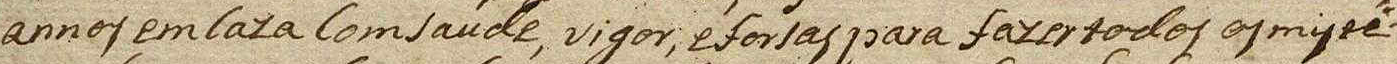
annos em Caza Com saude, vigor e forsas para fazer todos os misté
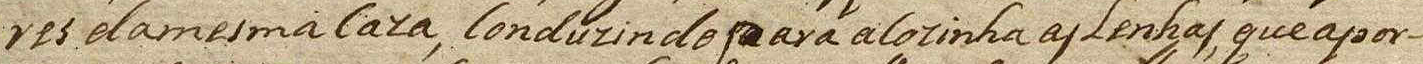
res da mesma Caza, Conduzindo para a Cozinha as Lenhas, que a por
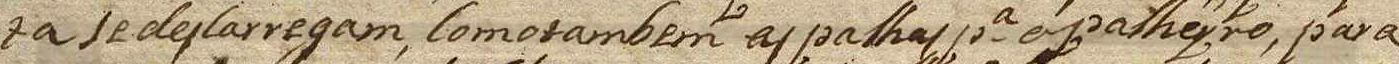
ta se desCarregam, Como tambem as palhas p.a o palheyro, para
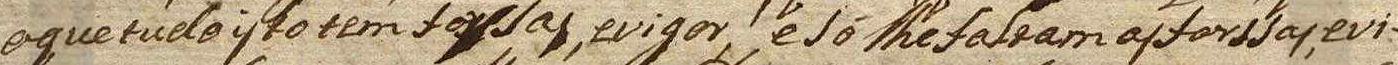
o que tudo isto tem forssas, e vigor, e só lhe faltam as forssas, e vi
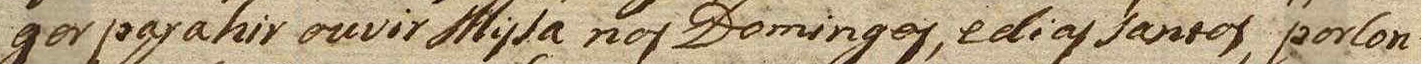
gor para hir ouvir Missa nos Domingos, e dias santos, por Con
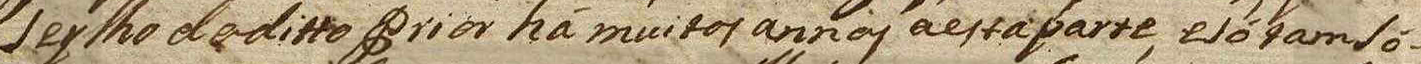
seylho do ditto Prior há muitos annos a esta parte, e só tam só
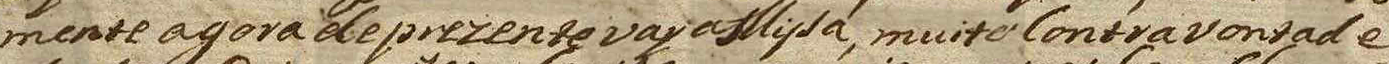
mente agora de prezente vay a Missa, muito Contra vontade
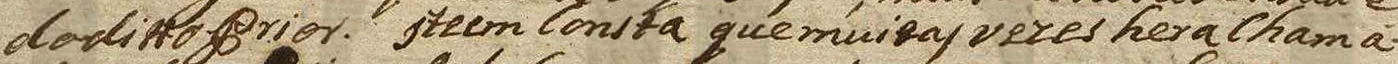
do ditto Prior. Iteem Consta que muitas vezes hera Chama
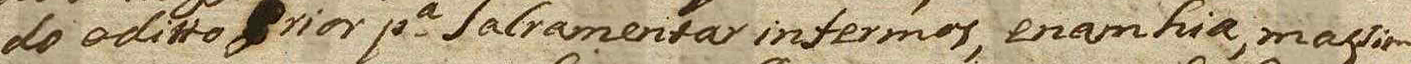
do o ditto Prior p.a SaCramentar infermos, e nam hia, mas sim
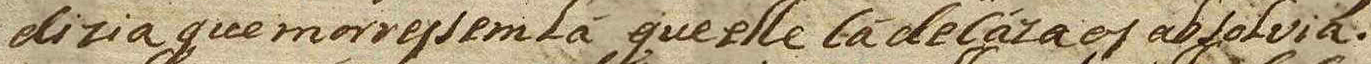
dizia que morressem Lá que elle Cá de Cáza os absoLvia.
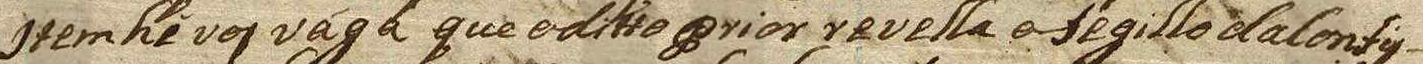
Jtem hé vos vága que o ditto prior revella o segillo da Confis
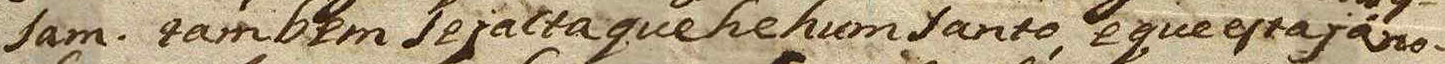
sam. tambem se jacta que he hum santo, e que esta já no
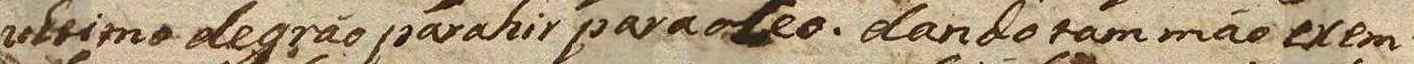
ultimo degráo para hir para o Ceo. dando tam máo exem
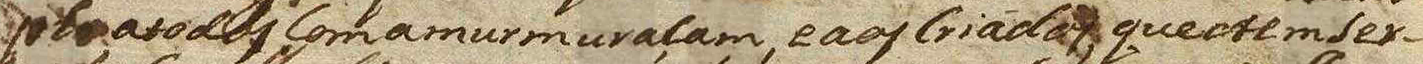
plo a todos Com a murmuraÇam, e aos Criados, que o tem ser
